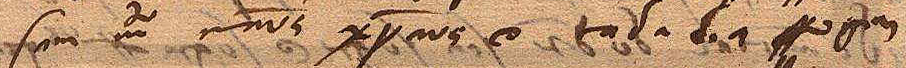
sam mto maos xpãos e cada dia ffogem
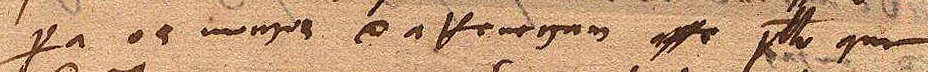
ꝑa os mouros e aRenegam a ffe p̄llo que
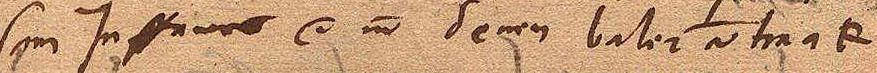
sam Jnffames e nō deuem valer cõtra a R
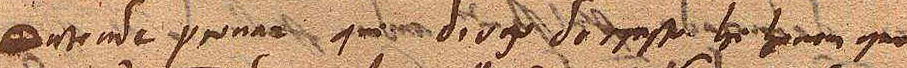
Entende prouar que diogo de crasto he homem que
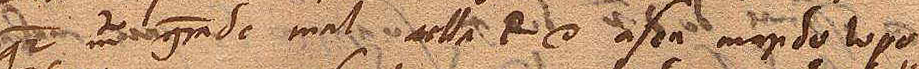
q̄r mto ḡrade mal a ella R e a seu marido lopo
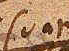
soarez
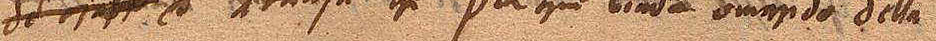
de crasto e a causa he porque vindo o marido della
